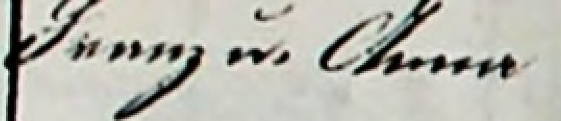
Franz u. Anna
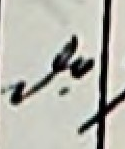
Do
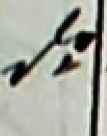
Do
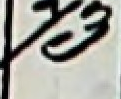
73
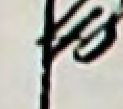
48
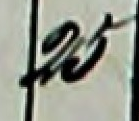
25
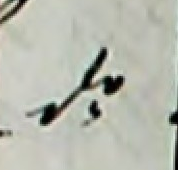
Do
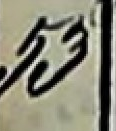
53
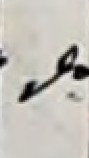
Do
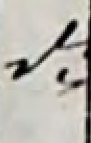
Do
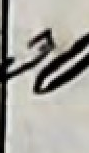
30
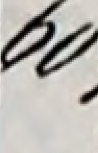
60
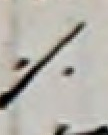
./.
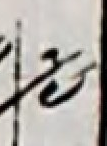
75
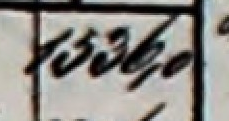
1536,0
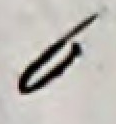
6
